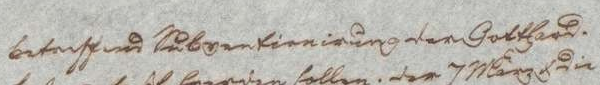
betreffend Subventionirung der Gotthard -
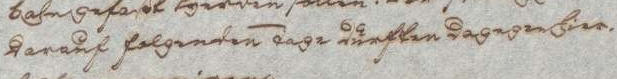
darauf folgenden Tage dürften dagegen hier-
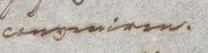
seits conveniren.
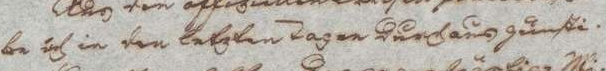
be ich in den letzten Tagen durchaus günsti-
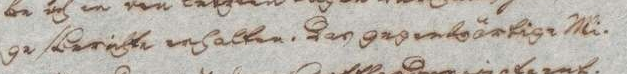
ge Berichte erhalten. Das gegenwärtige Mi-
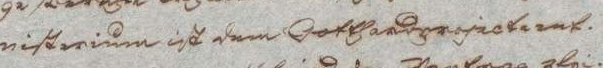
nisterium ist dem Gotthardprojecte ent-
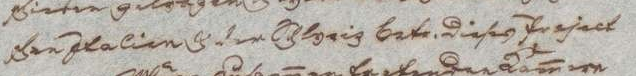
schen Italien & der Schweiz betr. dieses Project
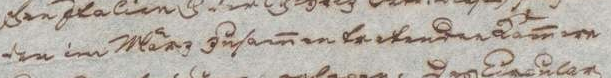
den im März zusammentretenden Kammern
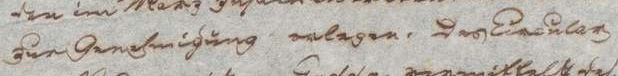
zur Genehmigung vorlegen. Das Circular
